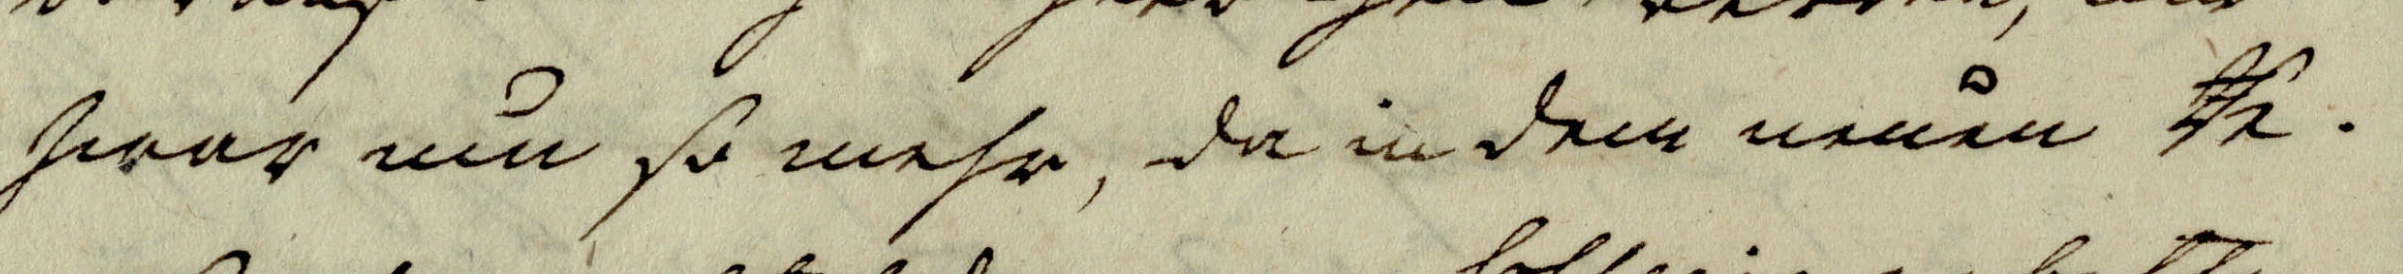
zwar um so mehr, da in dem neuen Re¬
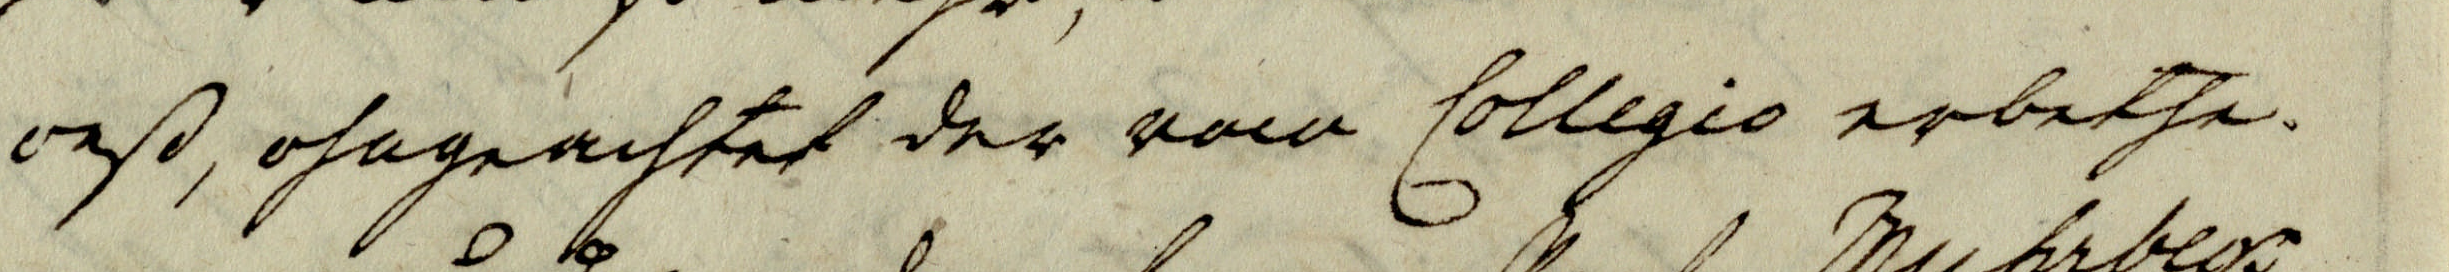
ceß, ohngeachtet der vom Collegio erbethe¬
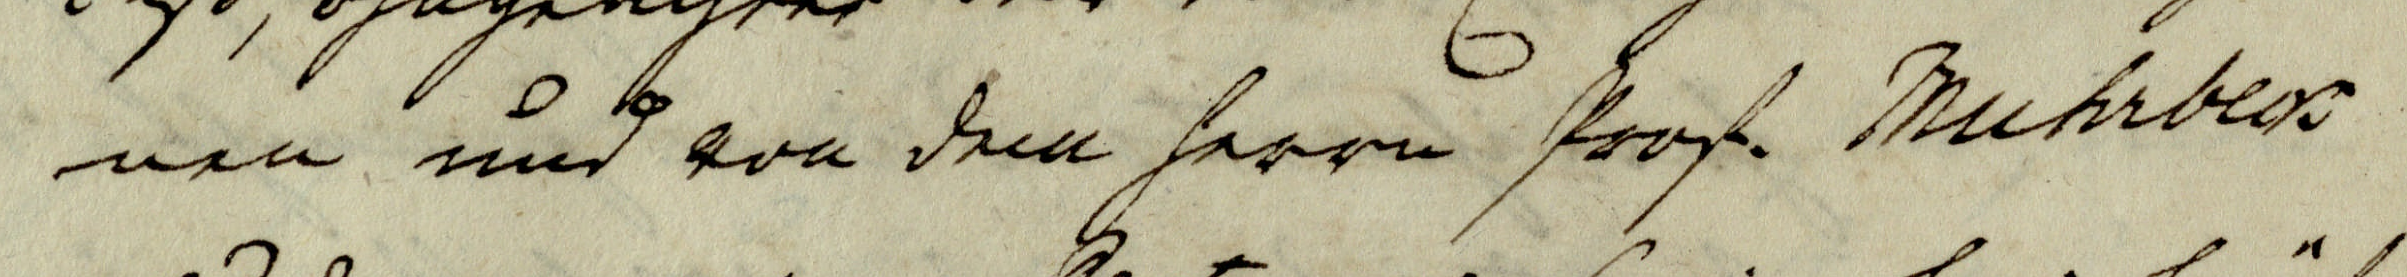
nen und von dem Herrn Prof. Muhrbeck
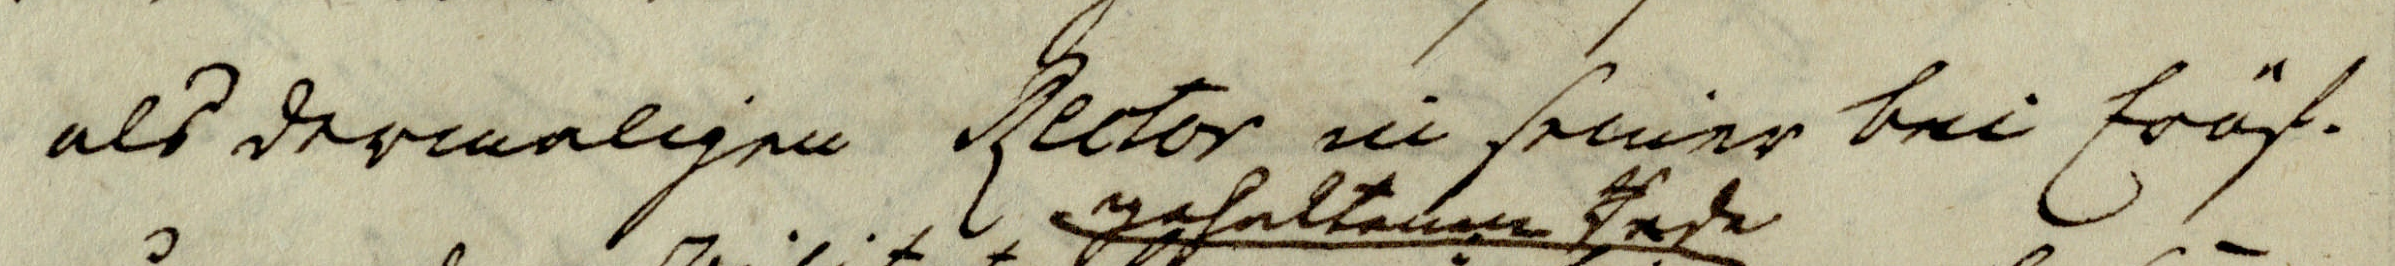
als dermaligen Rector in seiner bei Eröf¬
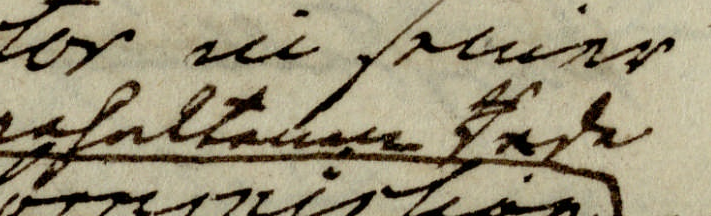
gehaltenen Rede
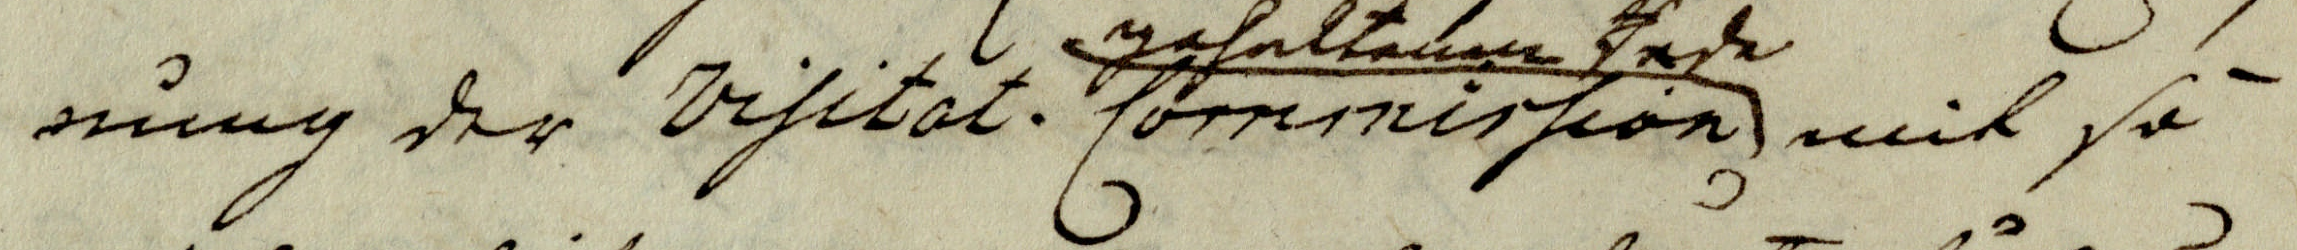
nung der Visitat. Commission mit so
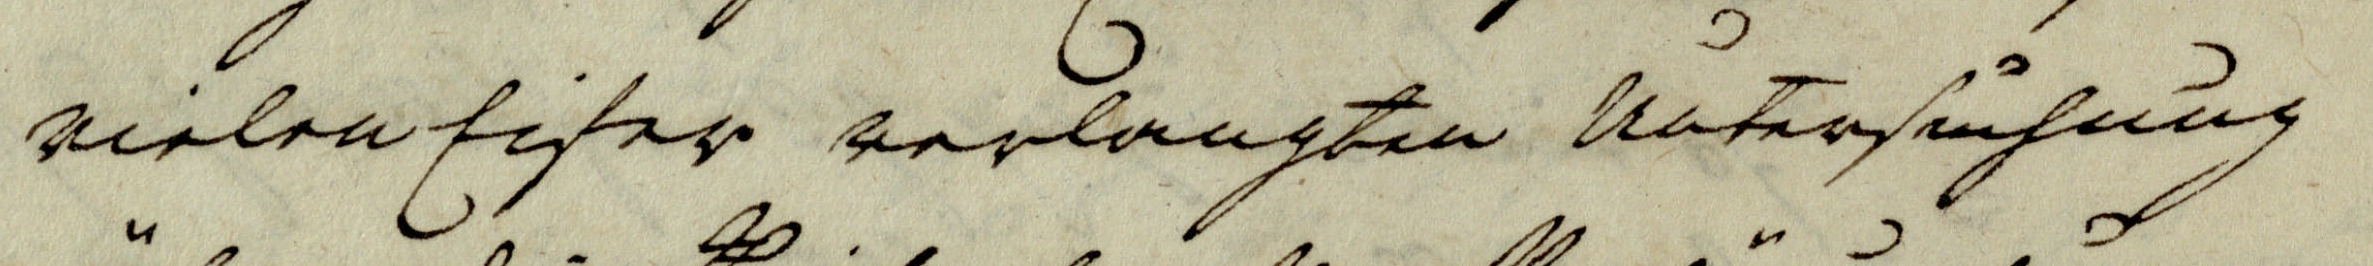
vielen Eifer verlangten Untersuchung
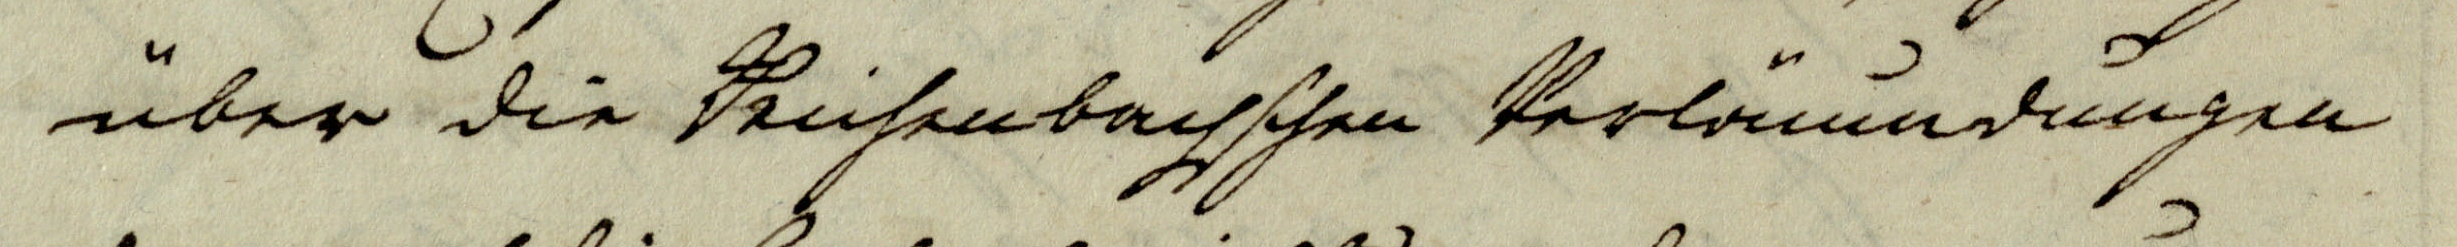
über die Reichenbachschen Verläumdungen
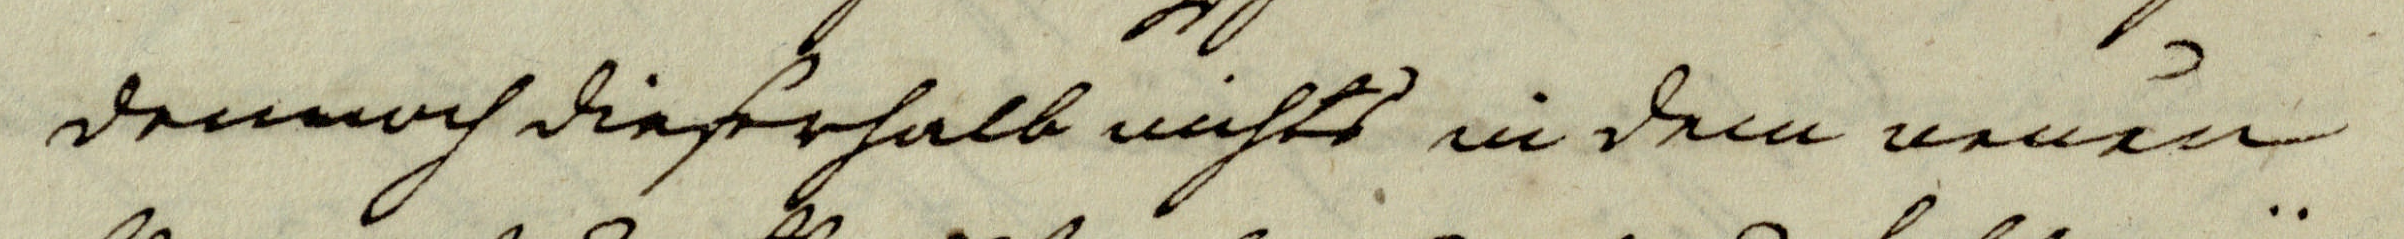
dennoch dieserhalb nichts in dem neuen
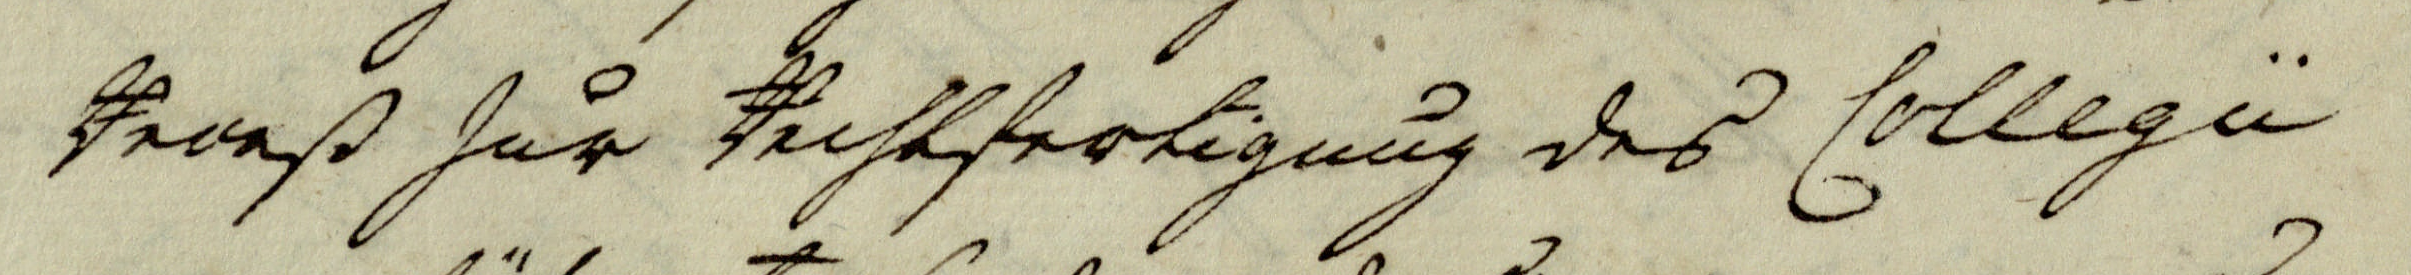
Receß zur Rechtfertigung des Collegii
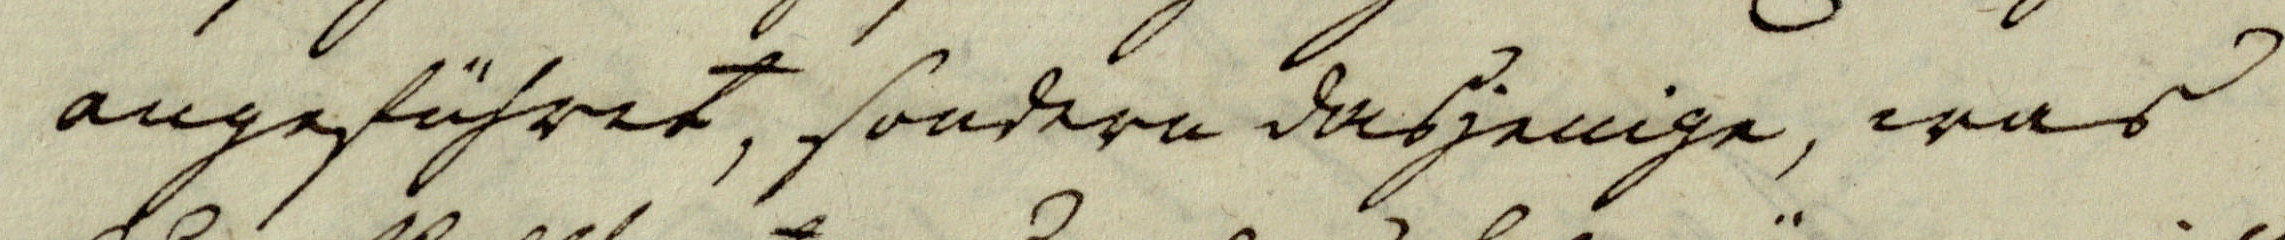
angeführet, sondern dasjenige, was
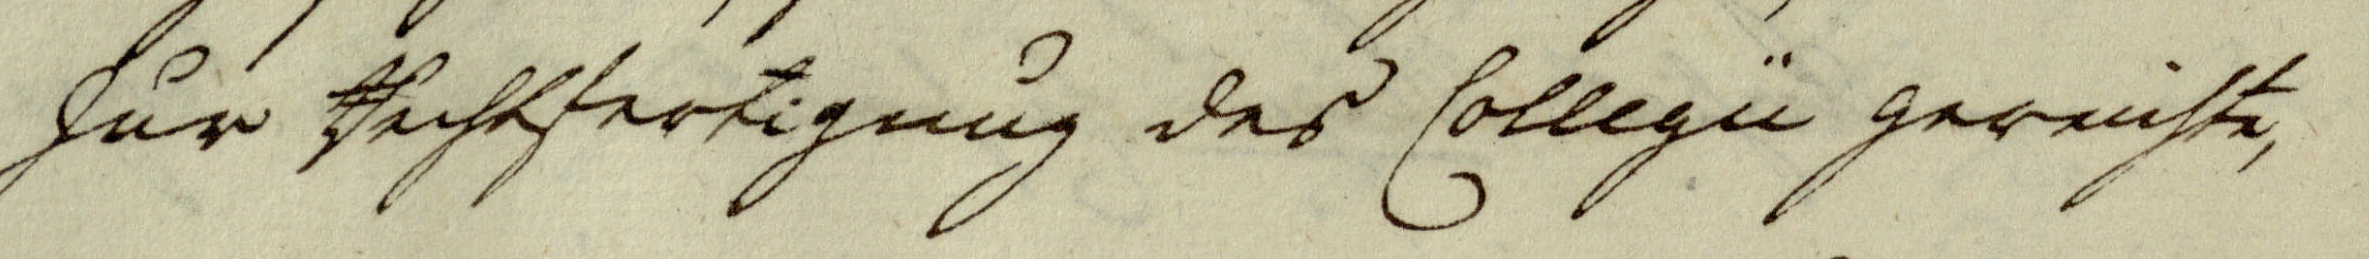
zur Rechtfertigung des Collegii gereichte,
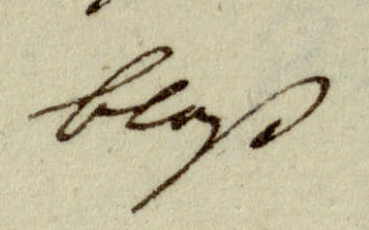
bloß
